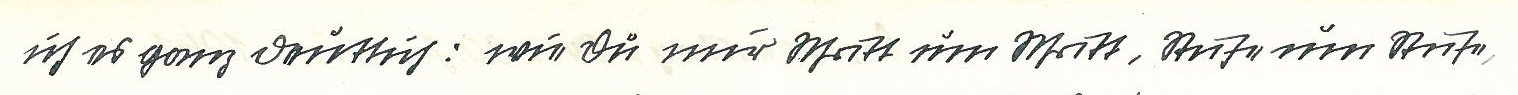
ich es ganz deutlich: wie Du mir Schritt für Schritt, Stufe um Stufe,
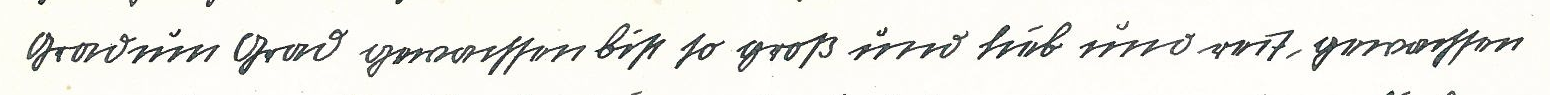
Grad um Grad gewachsen bist so groß und lieb und weit, gewachsen
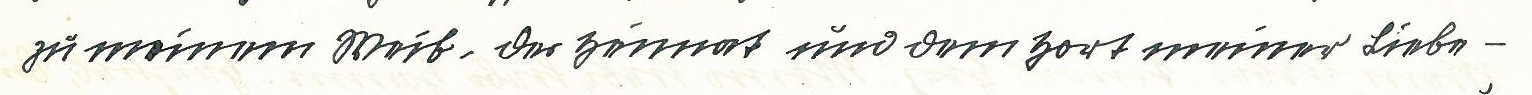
zu meinem Weib, der Heimat und dem Hort meiner Liebe –
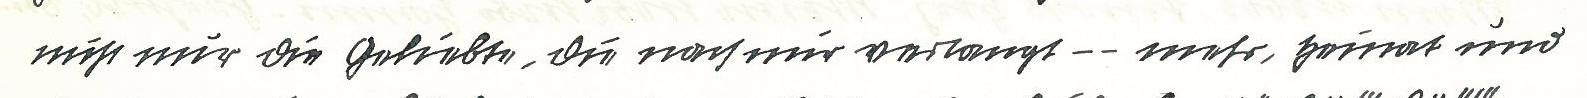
nicht nur Geliebte, die nach mir verlangt – – mehr, Heimat und
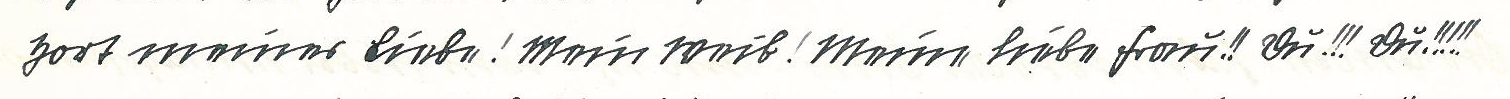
Hort meiner Liebe! Mein Weib! Meine liebe Frau!! Du!!! Du!!!!!
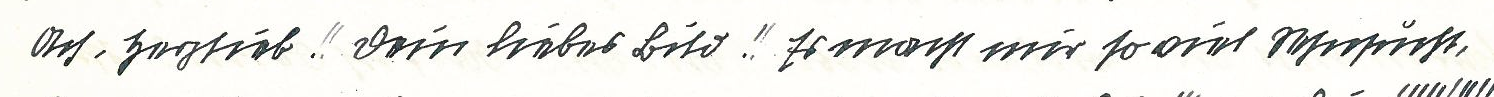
Ach, Herzlieb!! Dein liebes Bild!! Es macht mir so viel Sehnsucht,
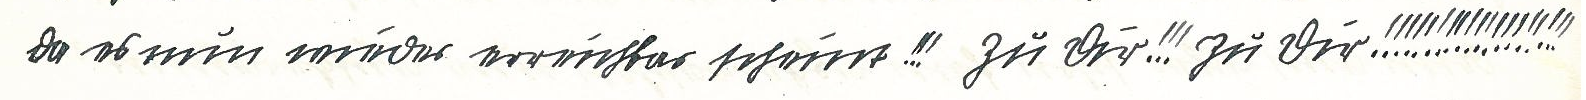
da es nun wieder erreichbar scheint!!! Zu Dir!!! Zu Dir!!!!!!!!!!!!!!!!!!!!
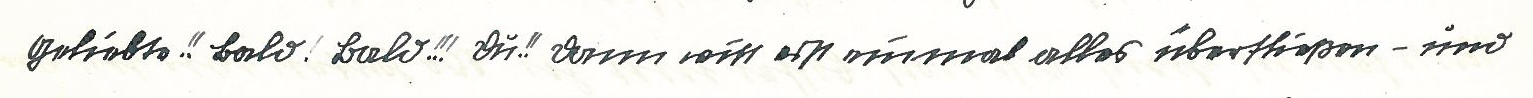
Geliebte!! Bald! Bald!!! Du!! Dann will erst einmal alles überfließen – und
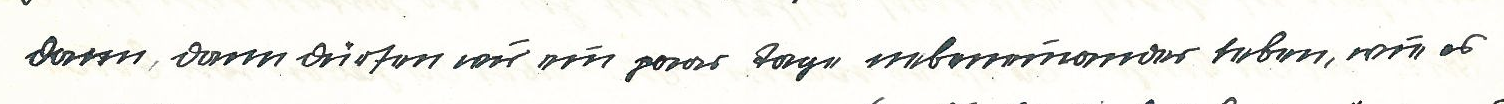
dann, dann dürfen wir ein paar Tage nebeneinander leben, wie es
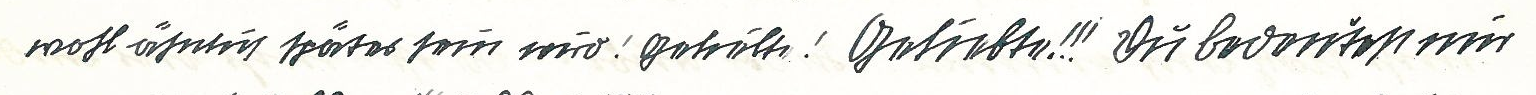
wohl ähnlich später sein wird! Geliebte! Geliebte!!! Du bedeutest mir
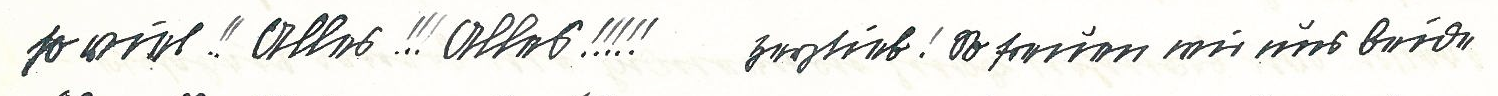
so viel!! Alles!!! Alles!!!!! Herzlieb! So freuen wir uns beide
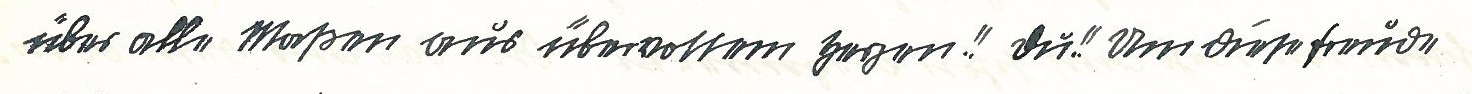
über alle Maßen aus übervollem Herzen!! Du!! Um diese Freude
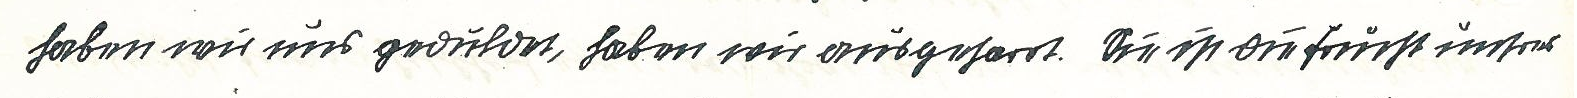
haben wir uns geduldet, haben wir ausgeharrt. Sie ist die Frucht unsres
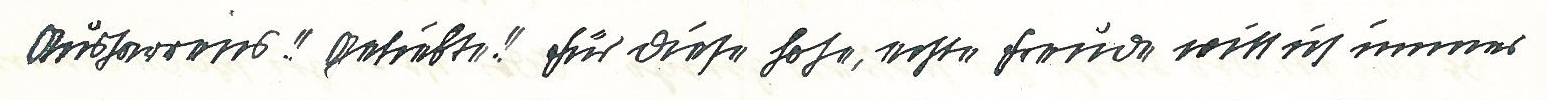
Ausharrens!! Geliebte!! Für diese hohe erste Freude will ich immer
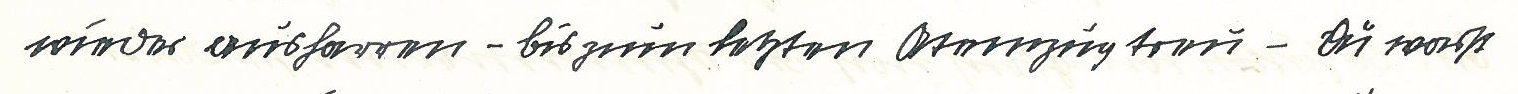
wieder ausharren – bis zum letzten Atemzug treu – Du warst
